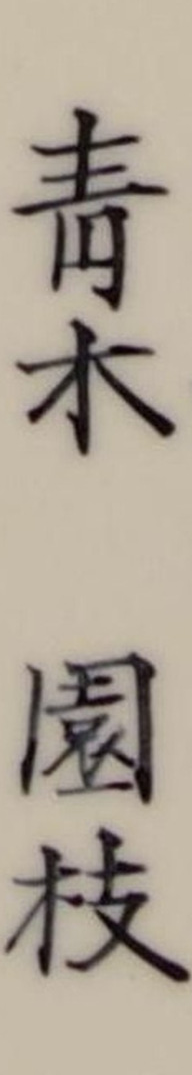青木園枝
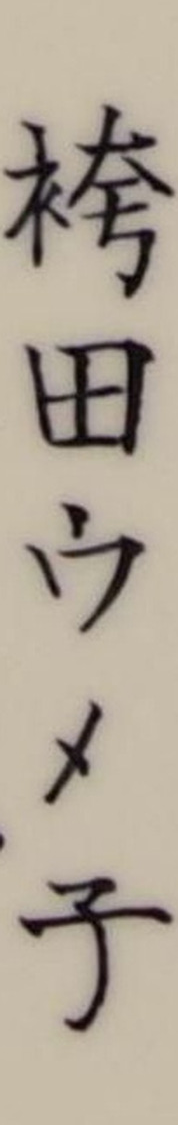袴田ウメ子
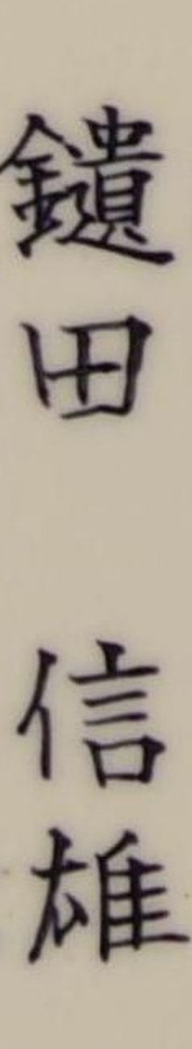鑓田信雄
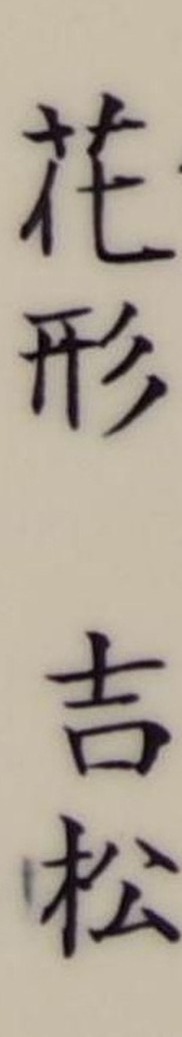花形吉松
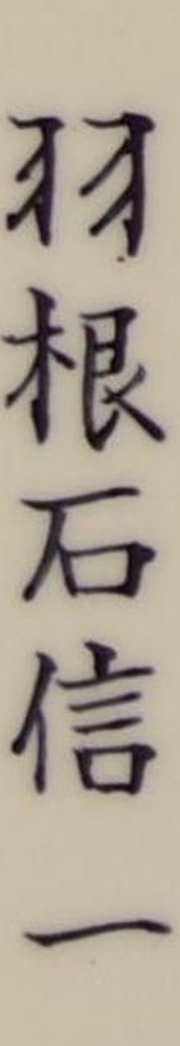羽根石信一
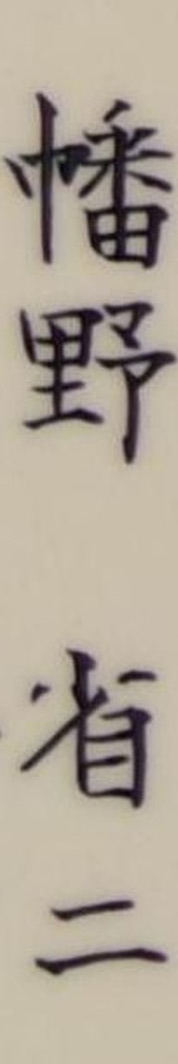幡野省二
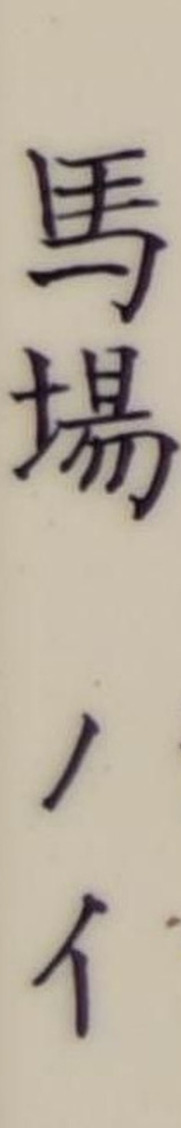馬場ノイ

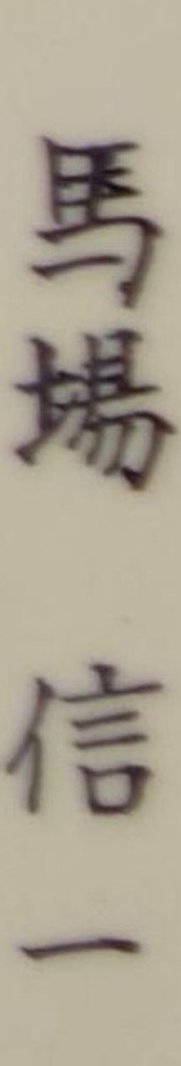馬場信一
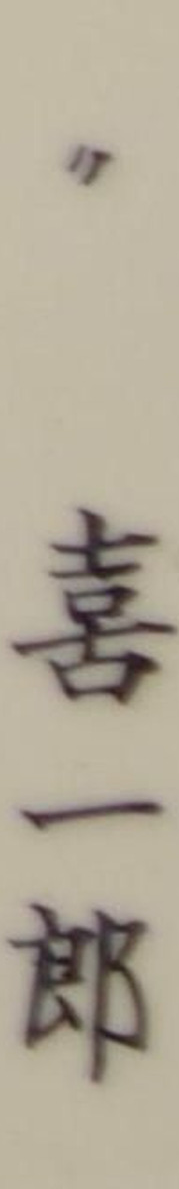喜一郎
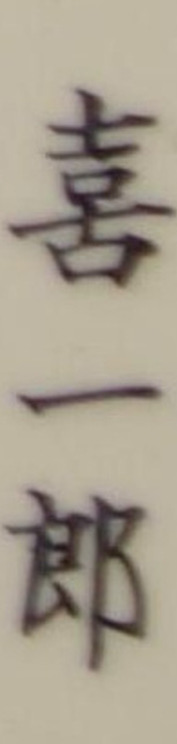喜一郎
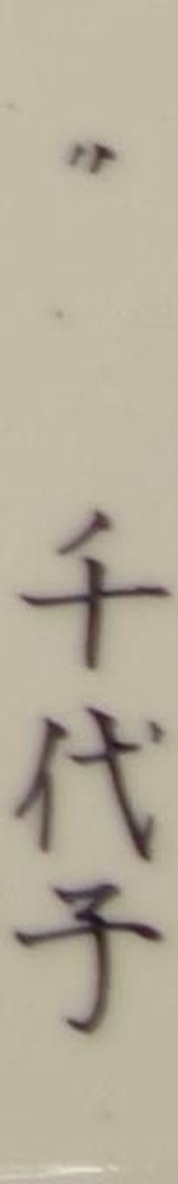千代子
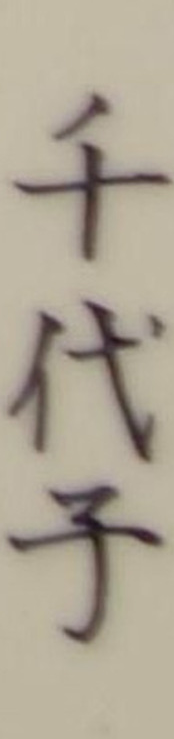千代子
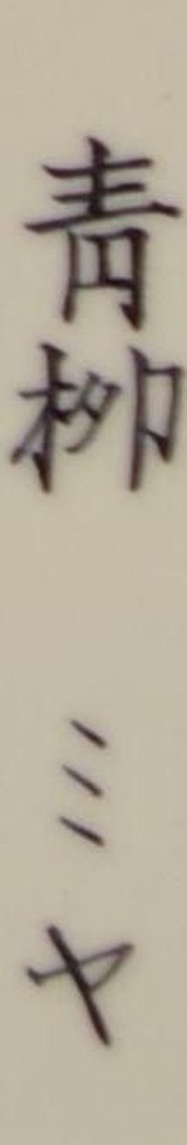青柳ミヤ
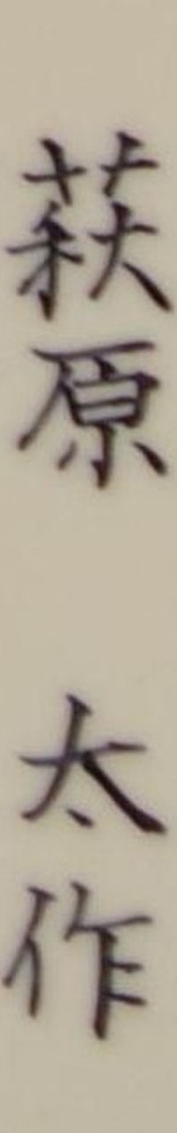萩原太作
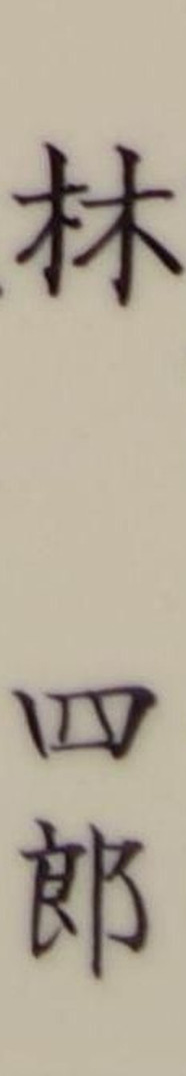林四郎
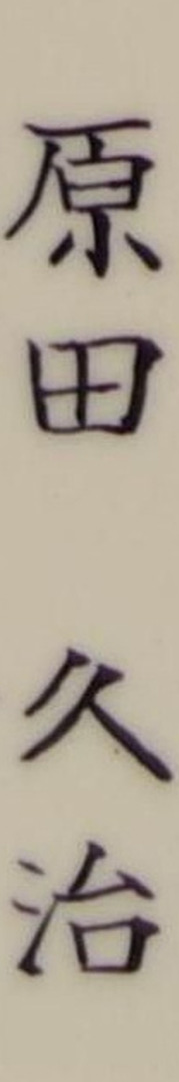原田久治
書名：M~S
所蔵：高野山金剛峯寺
